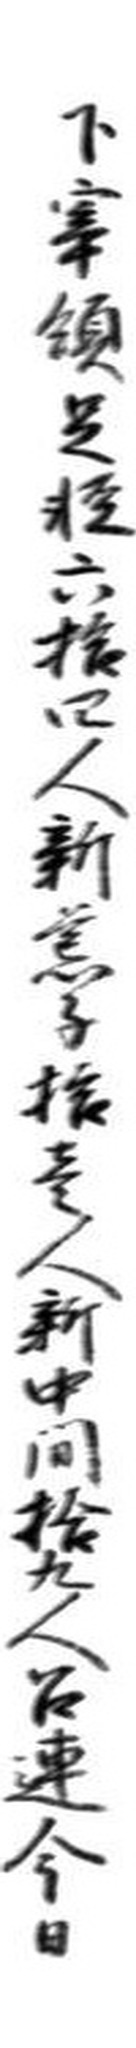下宰領足軽六拾四人新荒子拾壱人新中間拾九人召連今日
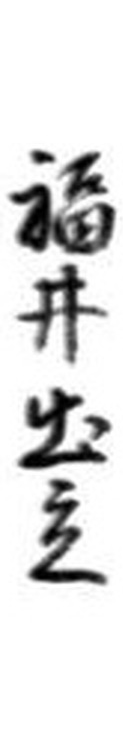福井出立
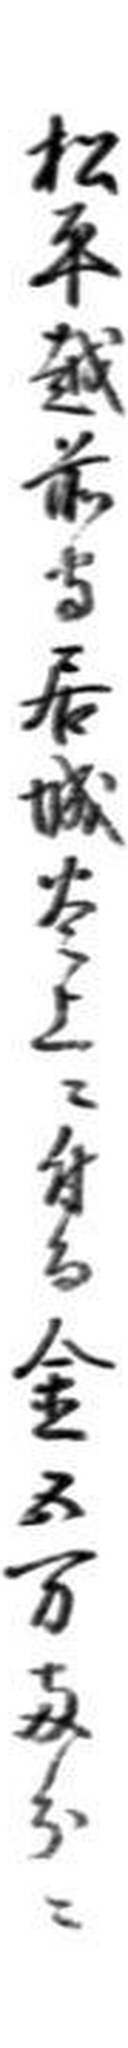松平越前守居城炎上ニ付而金五万両分ニ
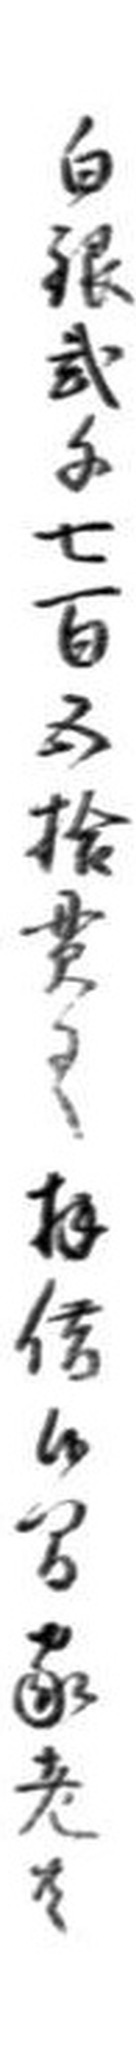白銀弐千七百五拾貫匁拝借候間家老共
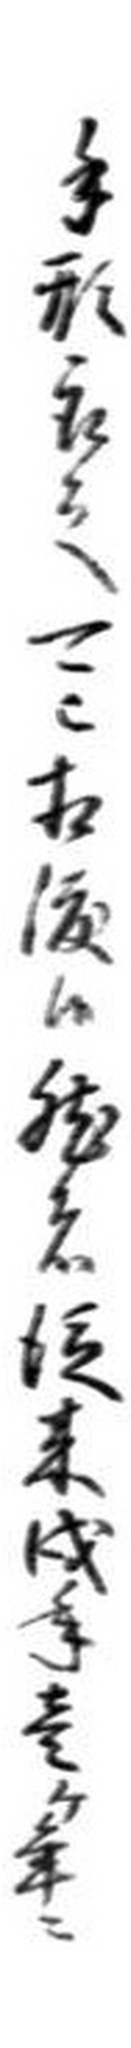手形取之可被相渡候然者従来戌年壱ヶ年ニ
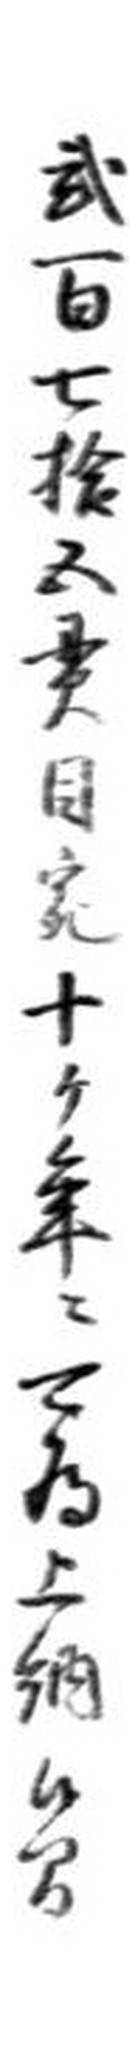弐百七拾五貫目宛十ヶ年ニ可為上納候間
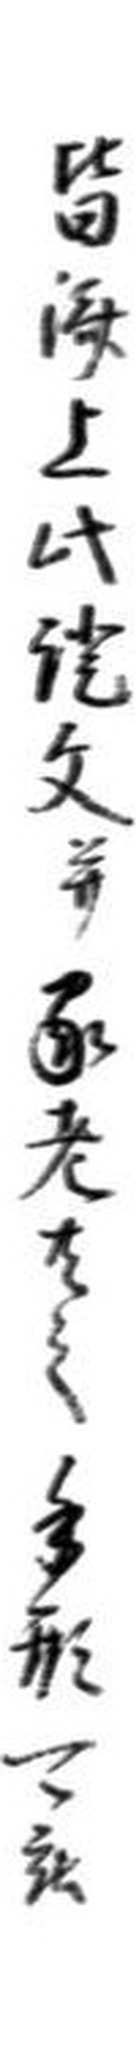皆済上此証文并家老共之手形可被

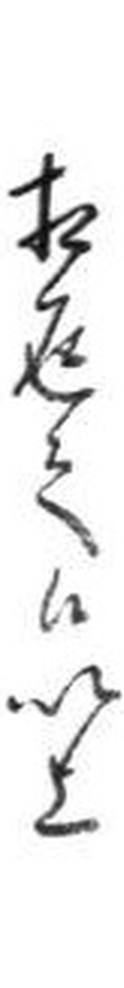相返之候以上
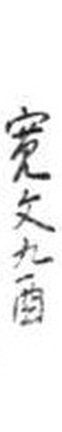寛文九酉
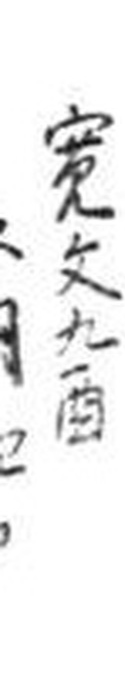寛文九酉
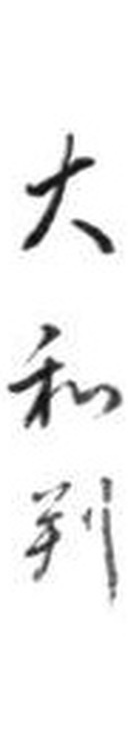大和判
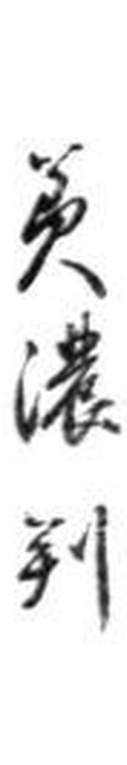美濃判
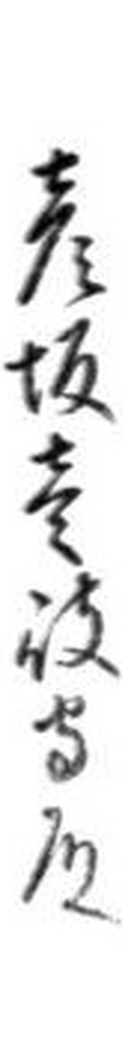彦坂壱岐守殿
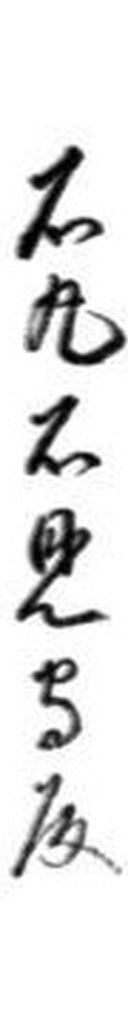石丸石見守殿
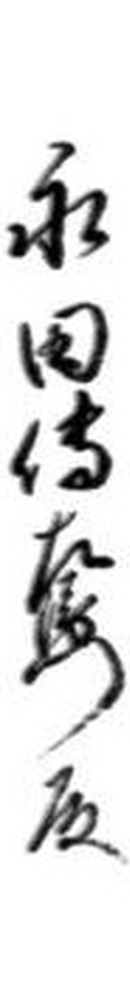永田伝左衛門殿
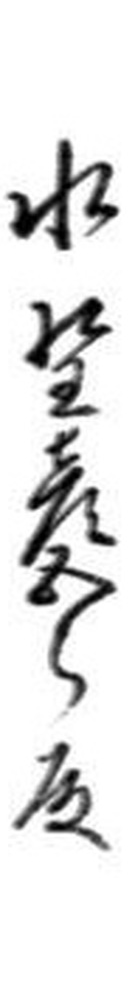水野彦五郎殿
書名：家譜 七 光通公 従寛文四年到同九年
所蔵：福井県文書館 Fukui Prefectural Archives
